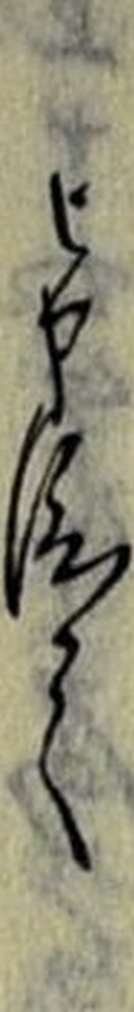被申渡之
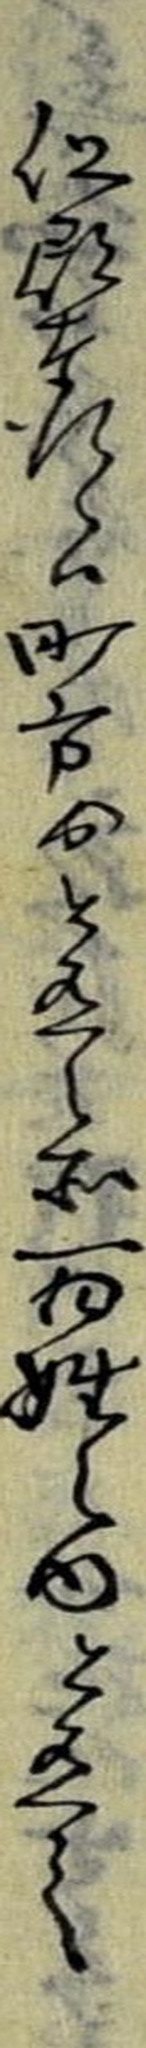但郡奉行へハ町方ゟと有之候所百姓之内と有之
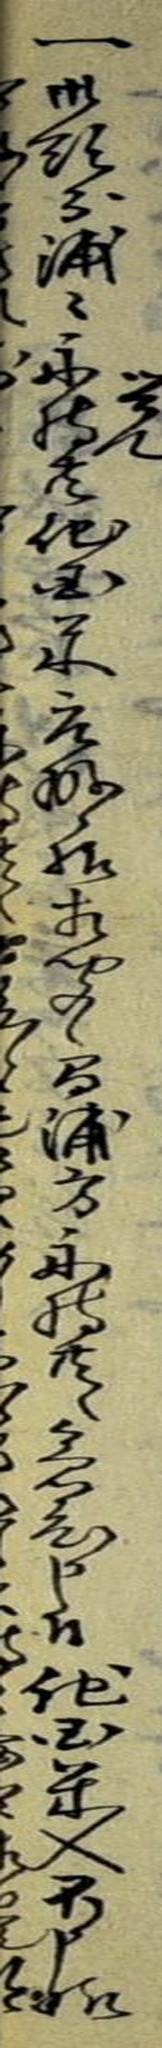一御領分浦々舟持共他国米取扱候様相聞候間浦方舟持共へ急度申付他国米入不申様
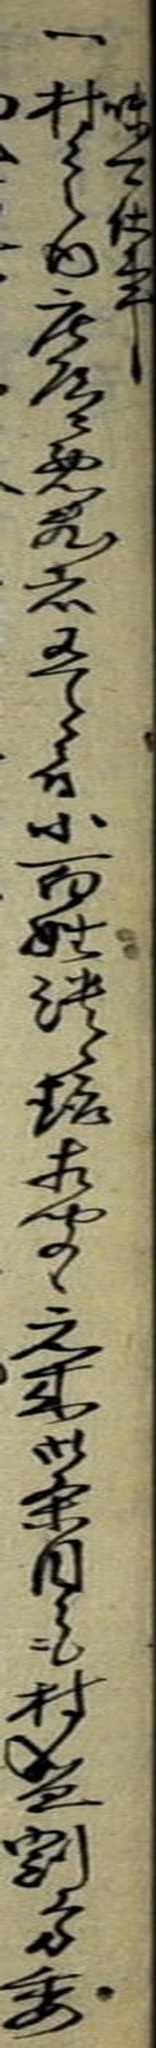一村々之内庄屋ニ悪敷者有之候ニ付小百姓潰之趣相聞候元来御条目ニも村盛割方委
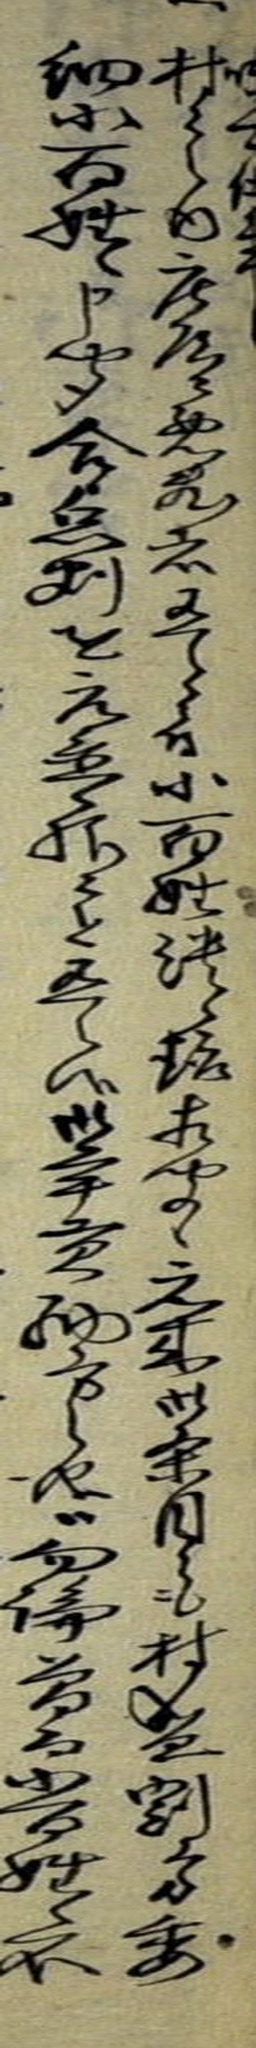細小百姓へ申聞合点判を取置候様ニと有之候御年貢納方之儀ハ勿論曽而小百姓へ不
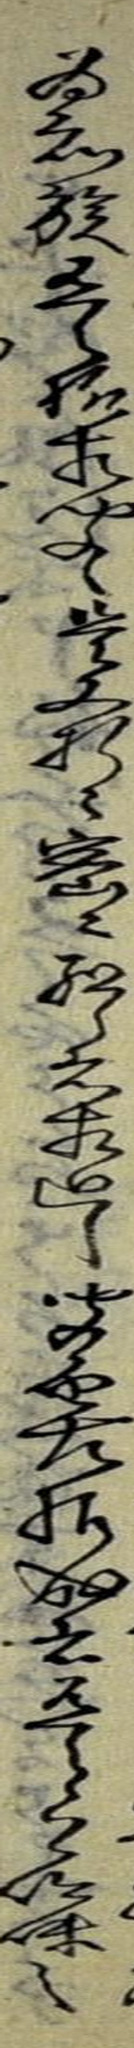為知族有之様相聞候是又折々密々組之者相廻し聞届左様成者有之候ハヽ吟味之
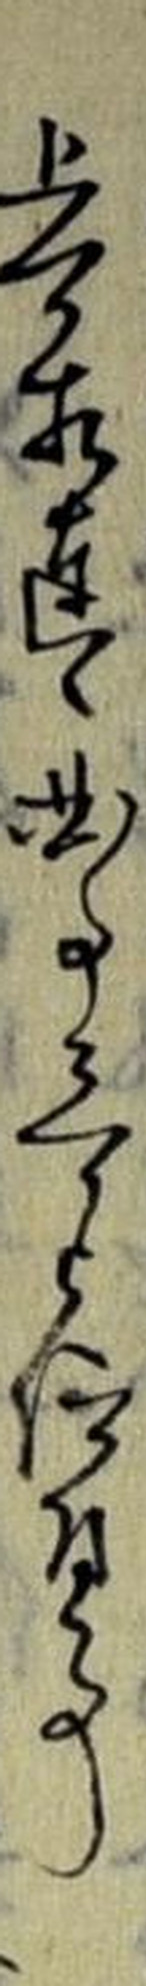上可相達候曲事ニ可被仰付事
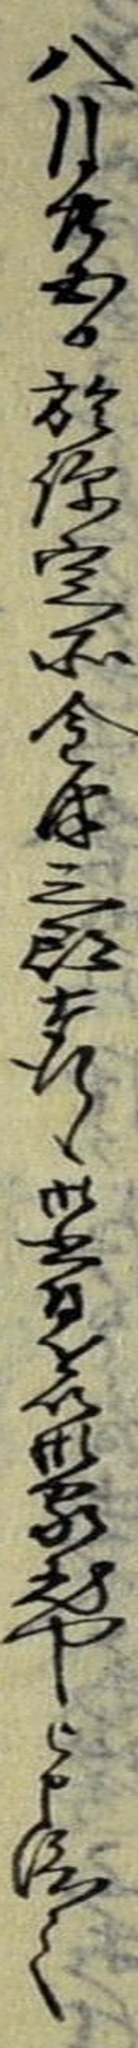八月廿五日於評定所金津三郡奉行へも御書付を以御家老中被申渡之
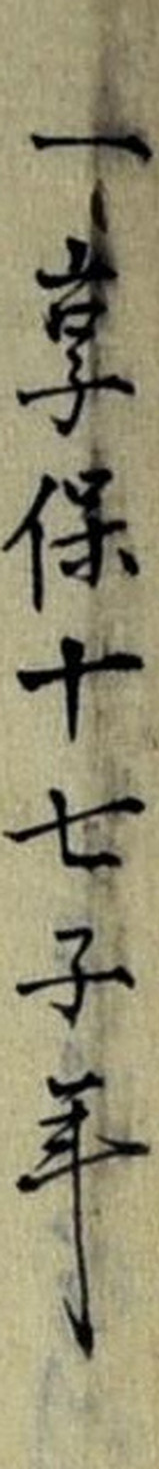享保十七子年
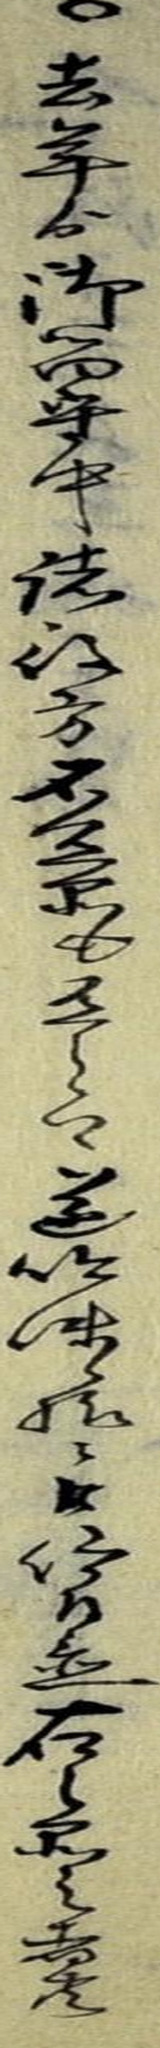〇去年ゟ御留守中諸役方不宜品も有之候ハヽ遂吟味候様ニ被仰付置右之品之者共
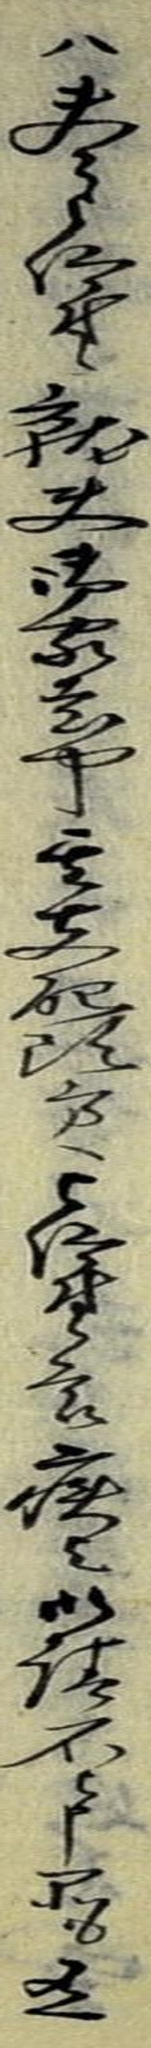ハ夫々被仰付候就夫御家老中其支配頭方へ被仰付候節疾与御請不被申品も有
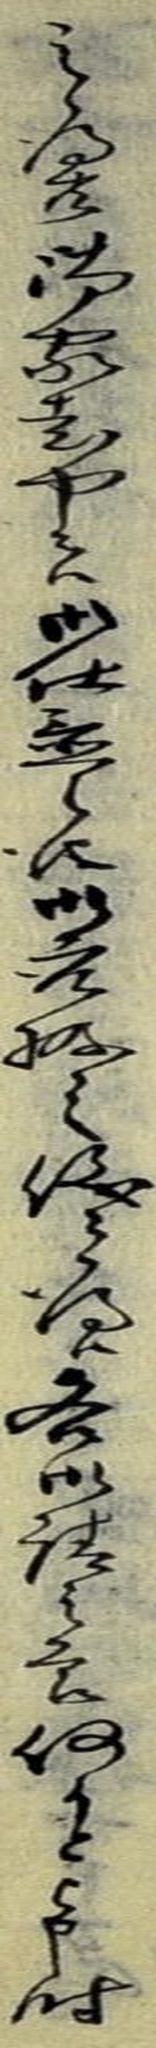之候得共御家老中ニハ御仕置候儀御取扱之儀ニ候得ハ各御請之節何かと被申時
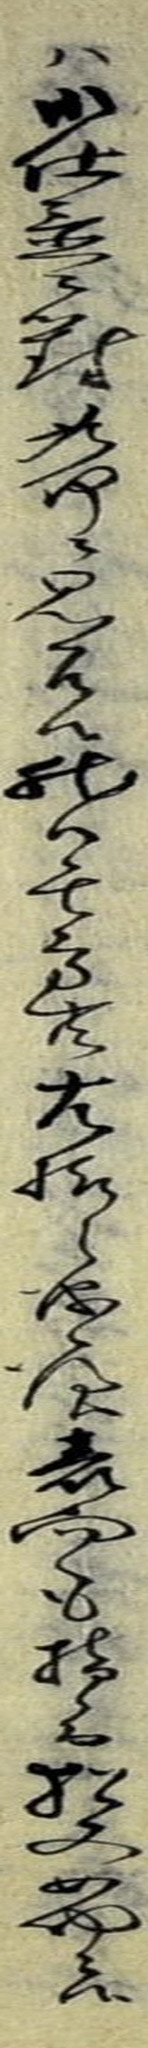ハ御仕置ニ対如何ニ思召候然ハ其方共左様之儀候得ハ表向へも指候而猶又如何ニ候
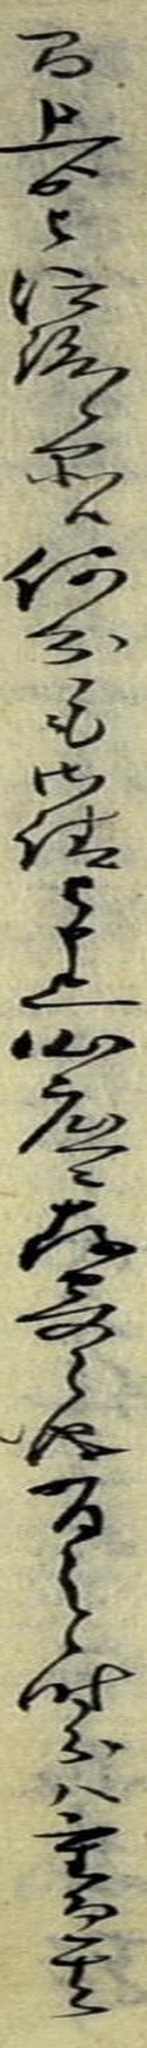間上ゟ被仰渡候品ハ何分ニも御請被申上心底ニ存寄候儀有之候時分ハ重而其
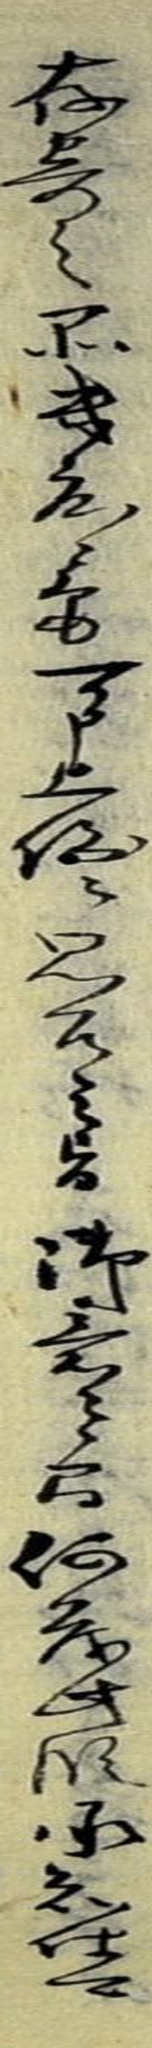存寄之品幾度ニ而も可申上儀ニ思召之旨御意ニ候間何茂此段承知仕可
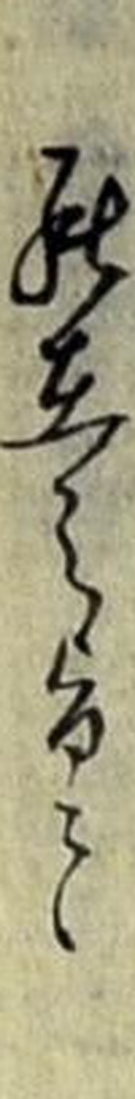罷在之旨ニ候
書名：命令之部 一
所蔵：福井県文書館 Fukui Prefectural Archives
